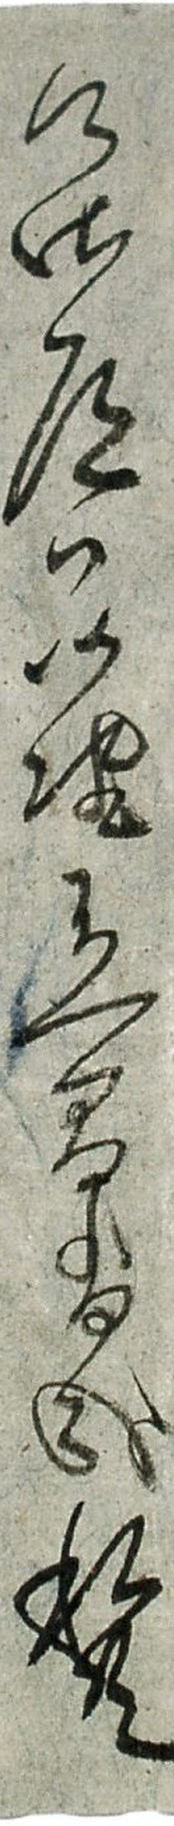候御道は御座有間布哉私共に
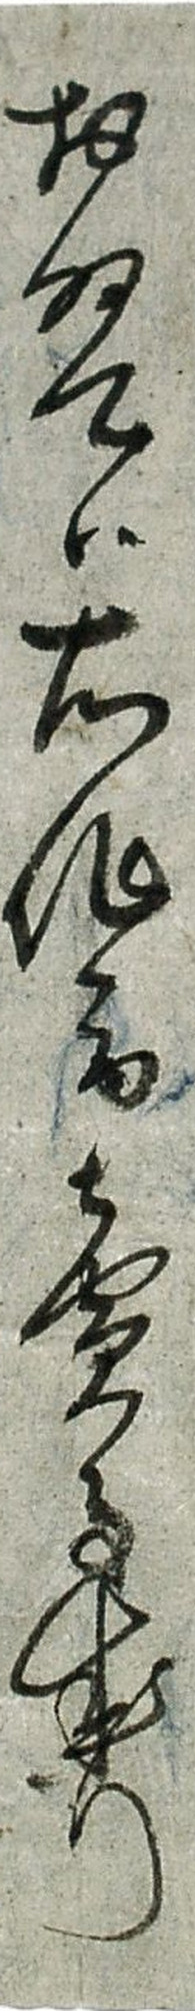おゐては右作方売事成行
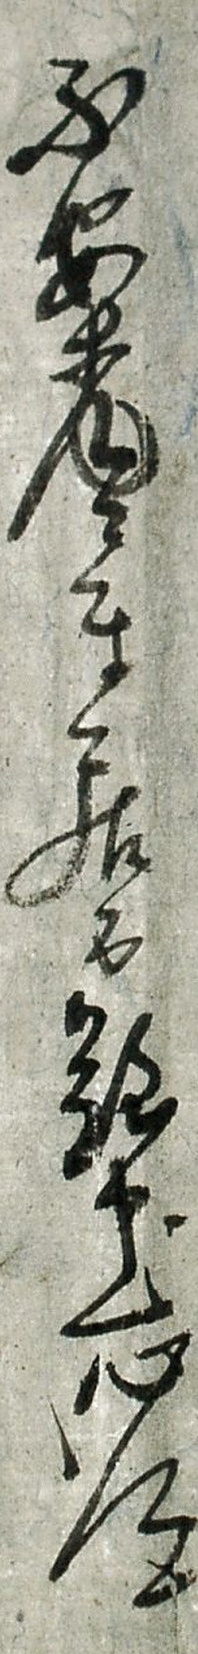不案内に付居て難申上心得
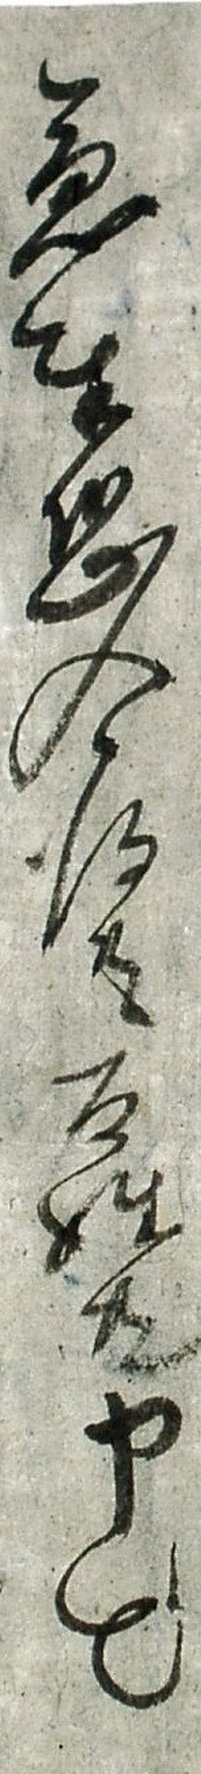兼奉恐入候得共百姓共申出
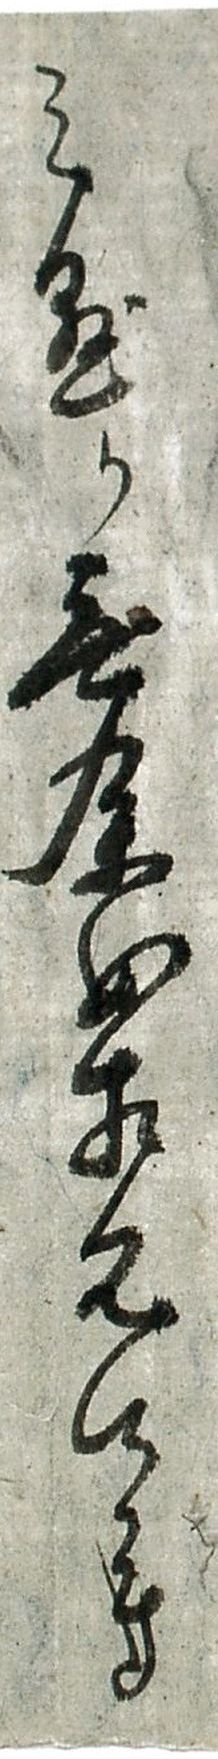之懸り無余義相見候に付
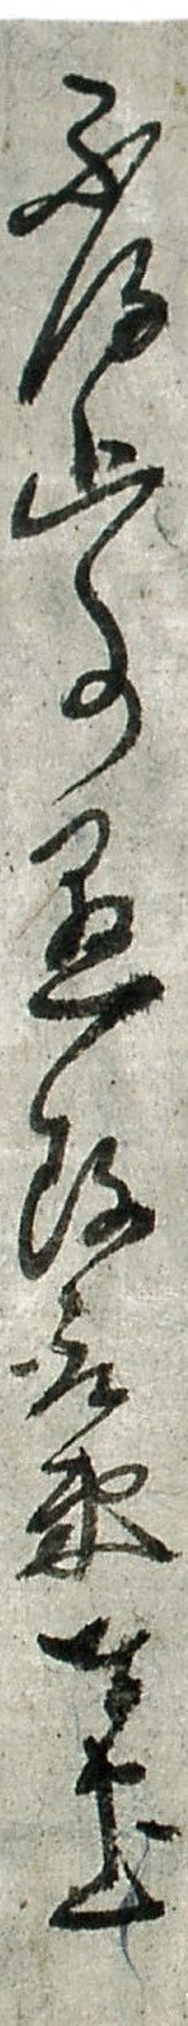不得止事懸改取束奉申上
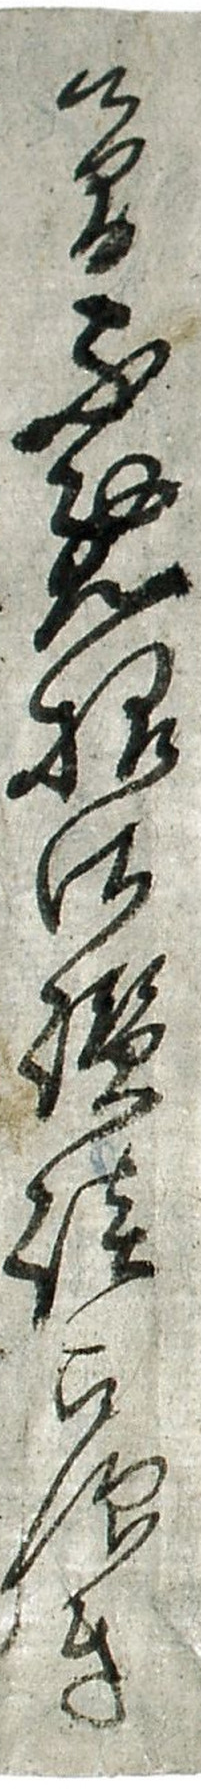候間不悪様御讃談被仰付
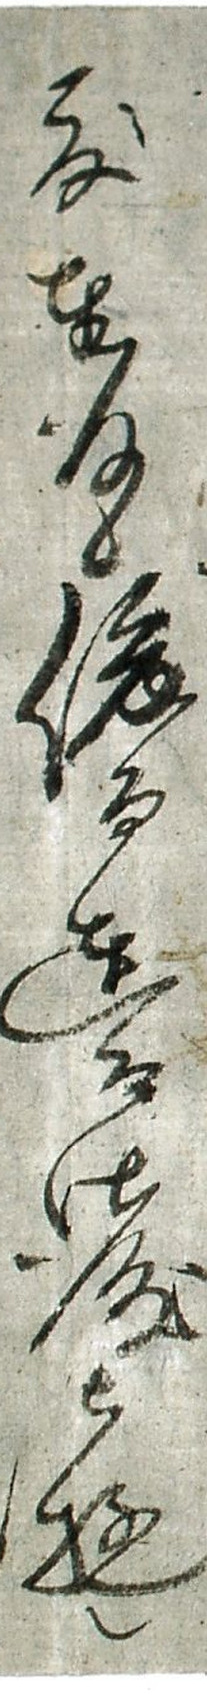度奉存候依て達て御渡被遊候
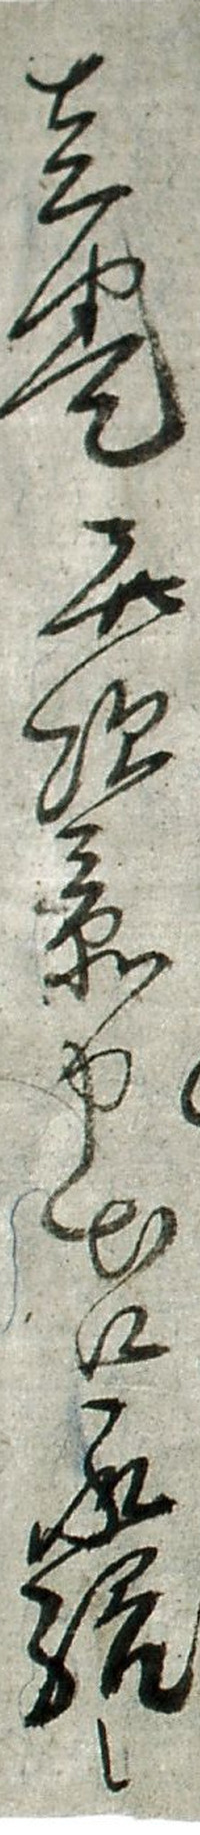壱巻喜次兵衛申出口承繕之
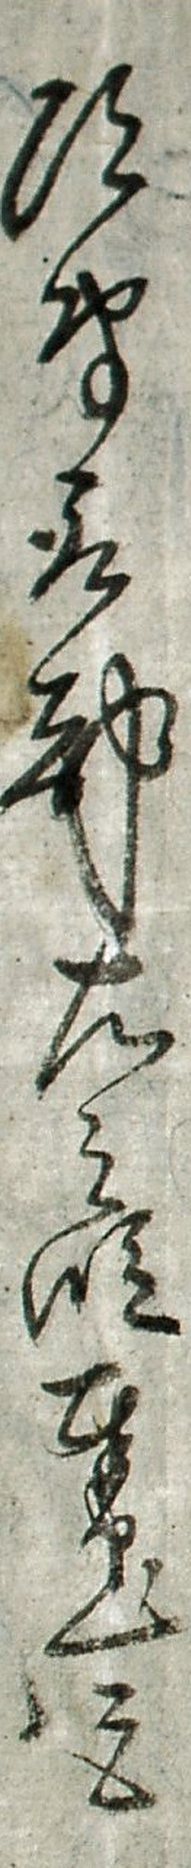次第取都右之段奉申上候
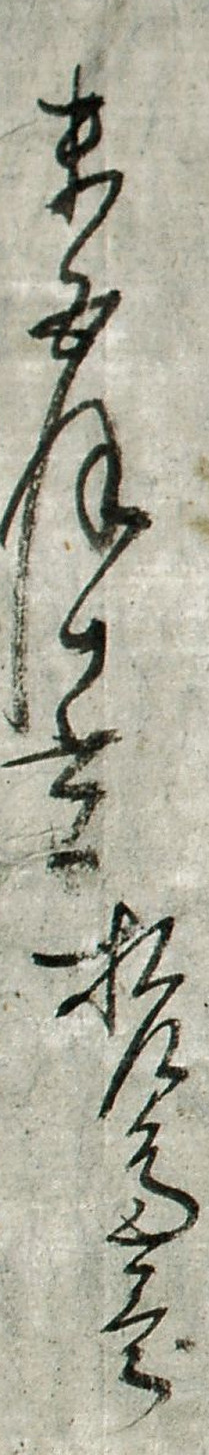未五月十六日松江島三郎
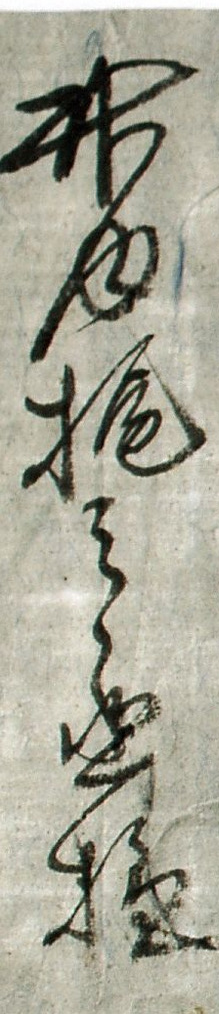竹内梶之丞様
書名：(美馬三好両郡百姓共煙草問屋壱手勘定ニ相成迷惑願右始末承申上書付之写）
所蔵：鳴門教育大学 Naruto University of Education
